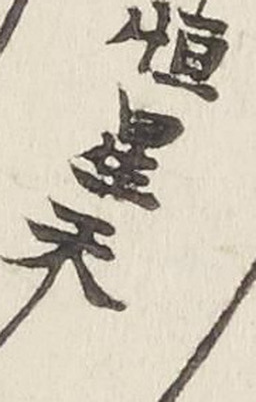恒星天
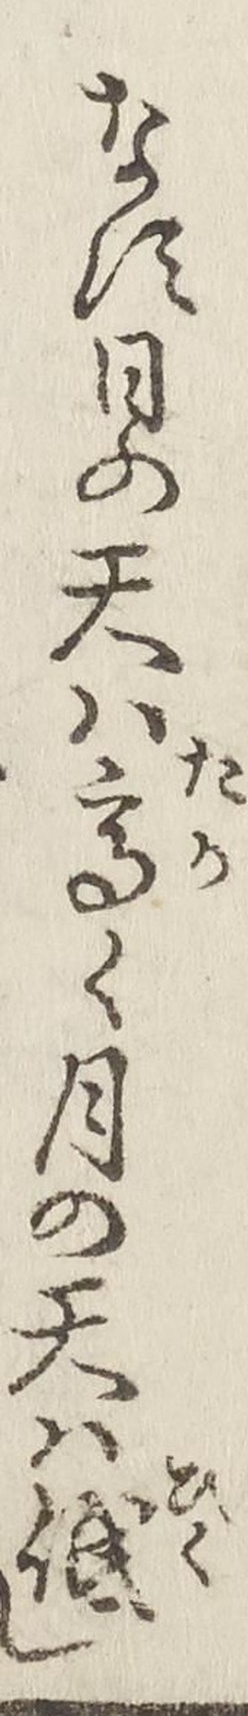なす日の天は高く月の天は低し
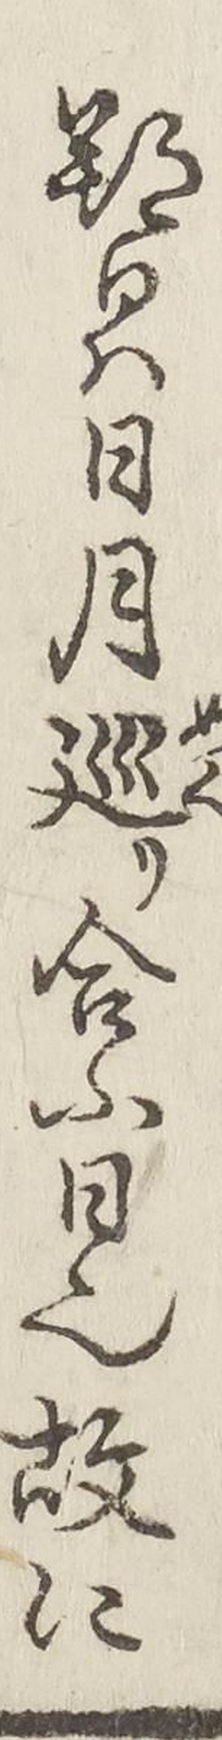朔日は日月巡リ合ふ日也故に
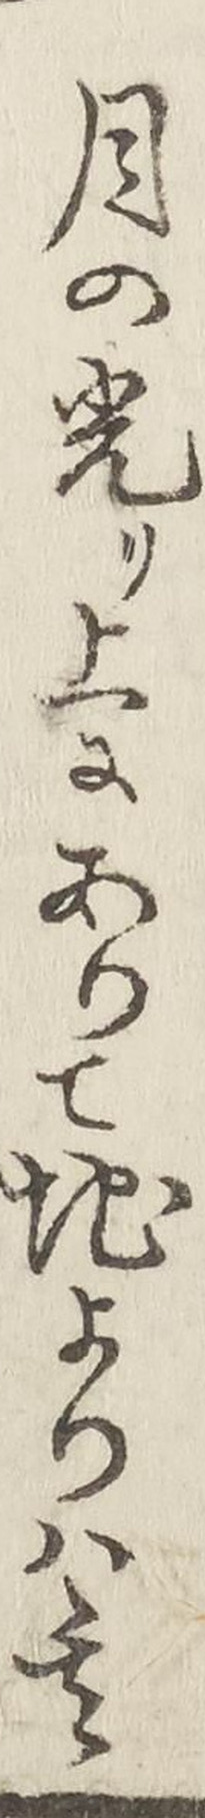月の光リ上にありて地よりは其
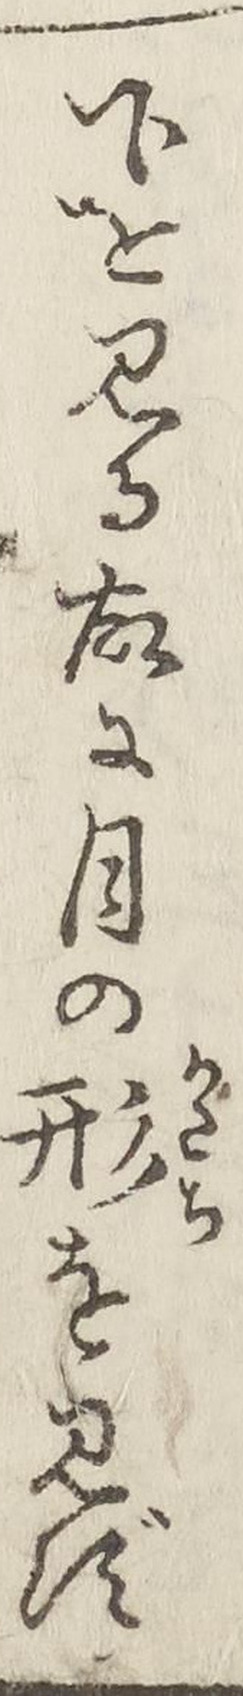下を見る故に月の形を見ず
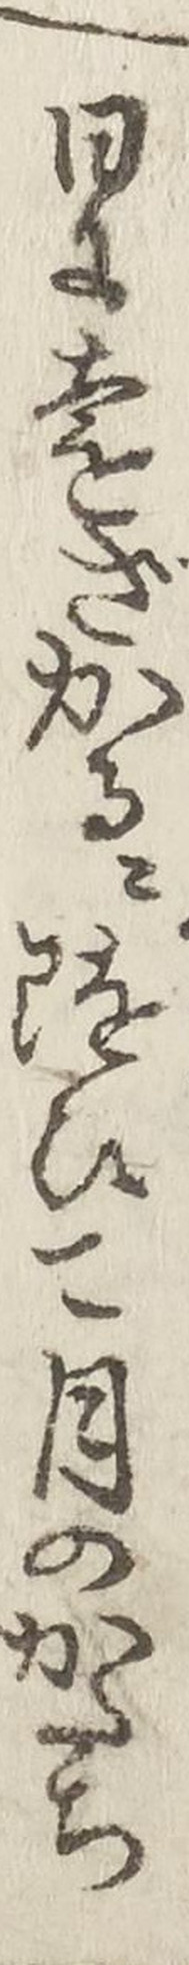日に遠ざかるニ随ひて月のかたち
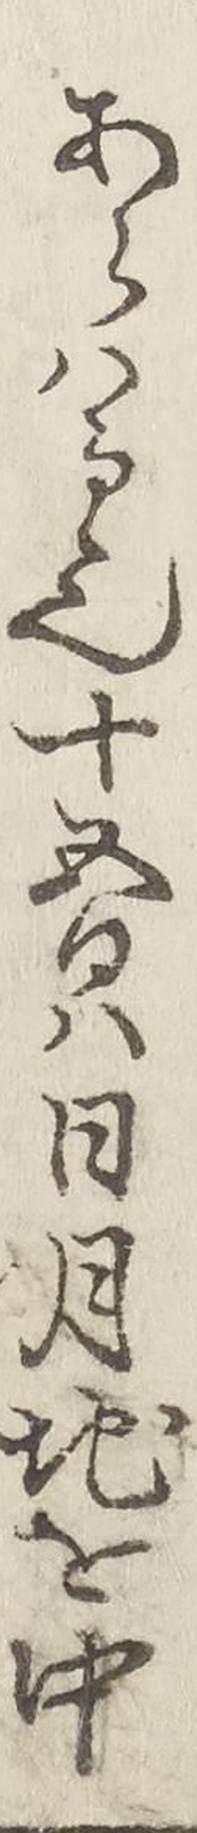あらはるゝ也十五日は日月地を中
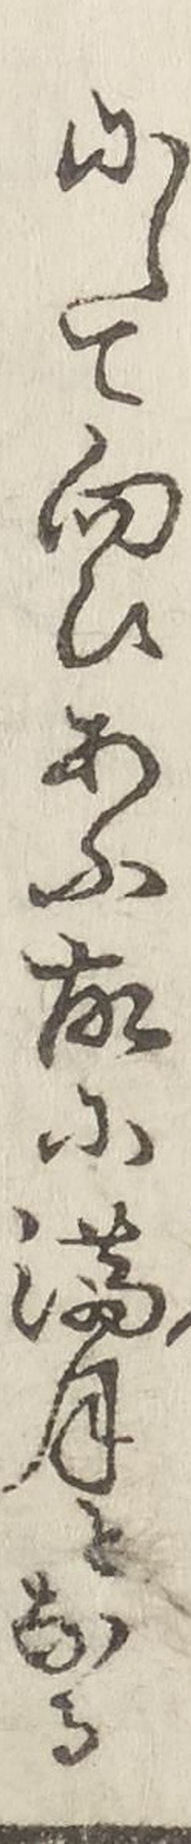にして向ひあふ故に満月となる
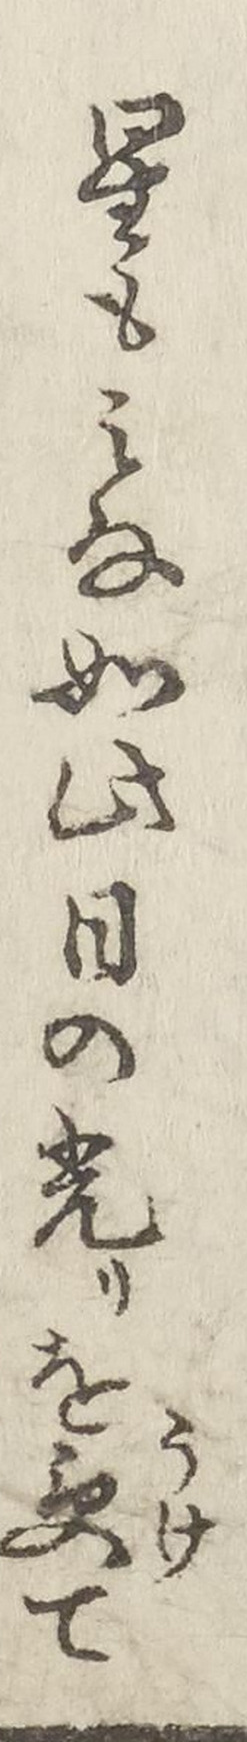星もみな如此日の光リを受て
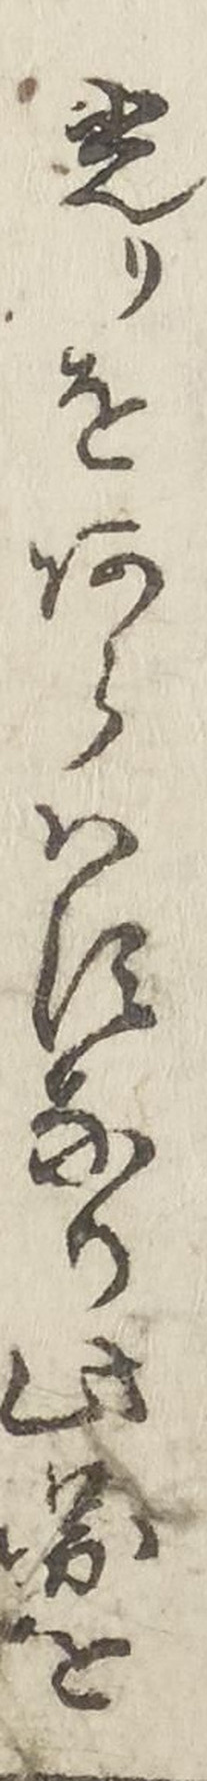光リをあらはすなり此図を
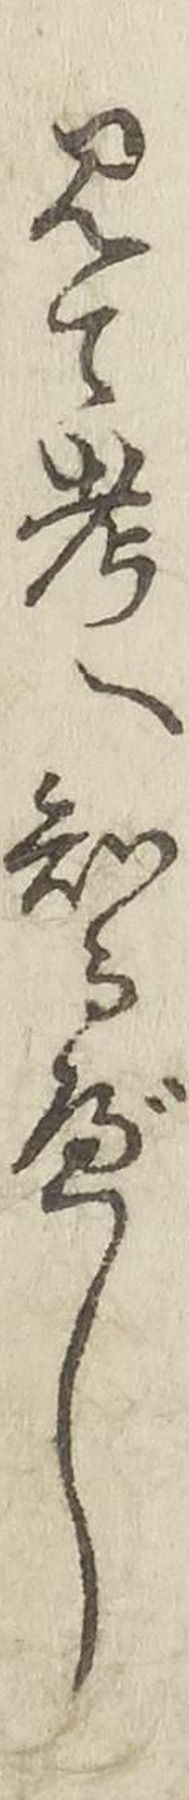見て考へ知るべし

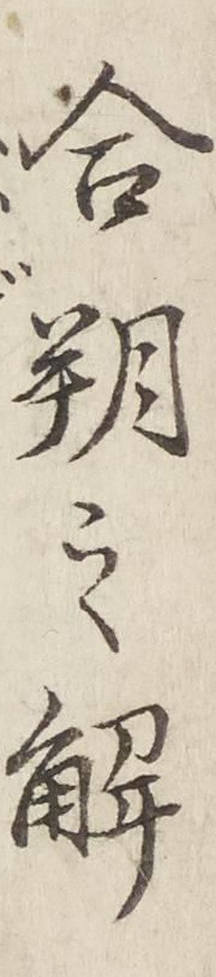合朔之解
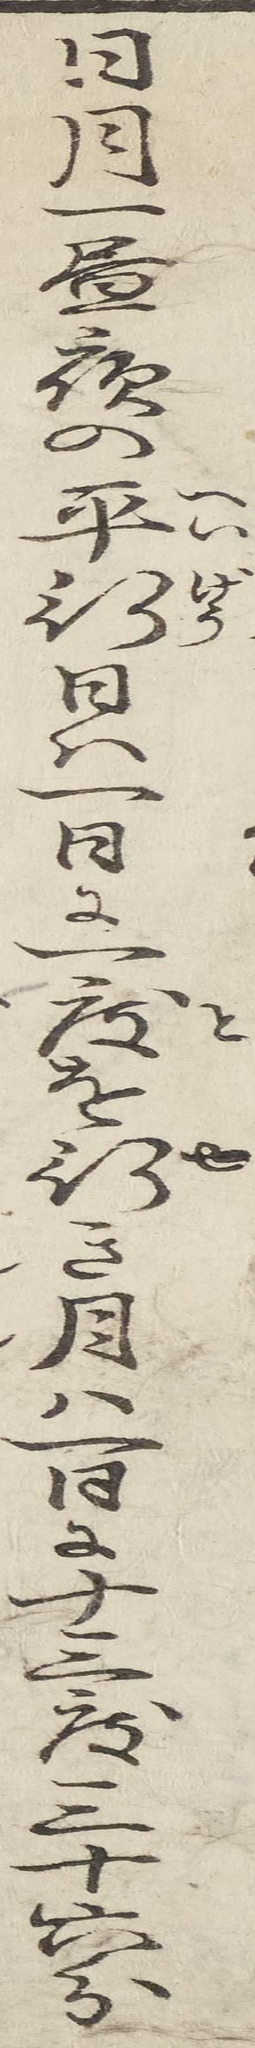日月一昼夜の平行日は一日に一度を行き月は一日に十三度三十六分
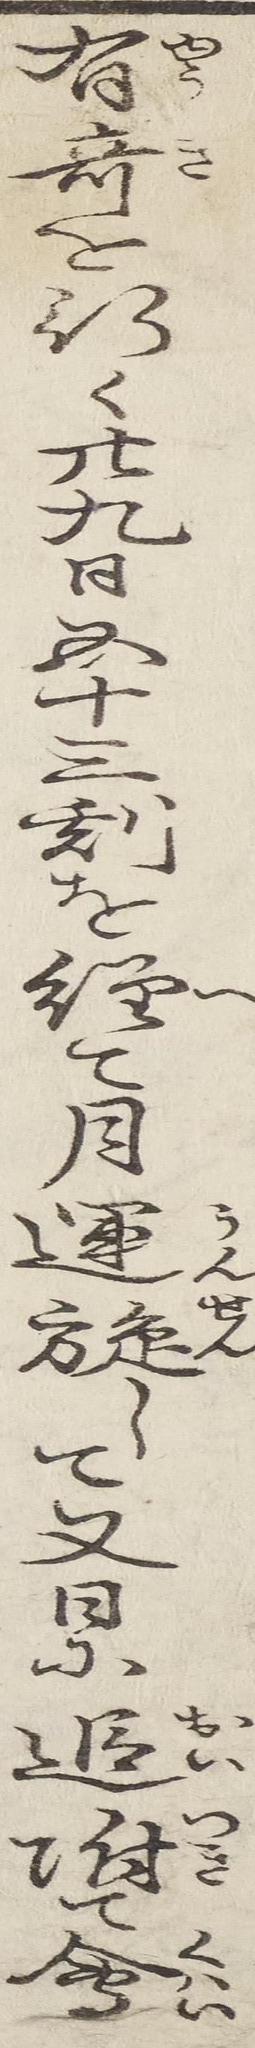有奇を行く廿九日五十三刻を経て月運旋して又日に追附て会
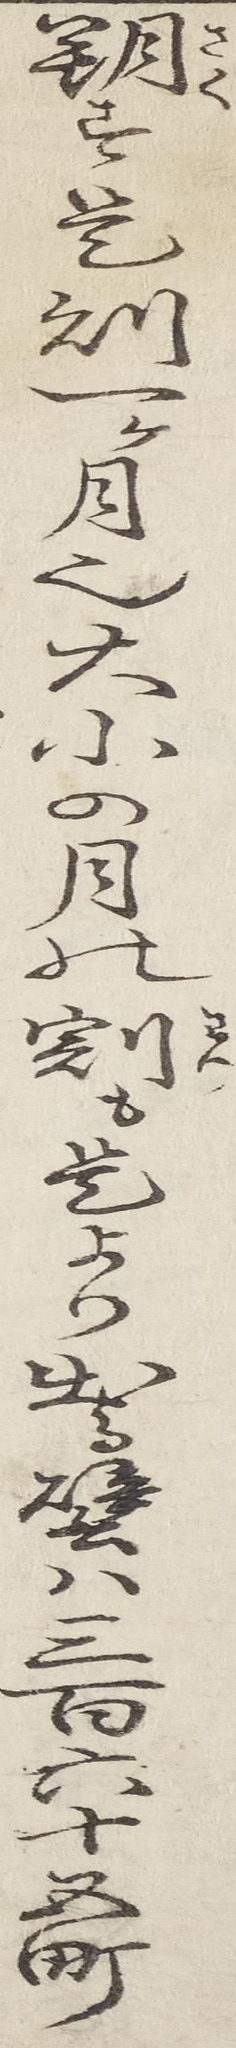朔す是則一ケ月也大小の月の割も是より出る譬は三百六十五町
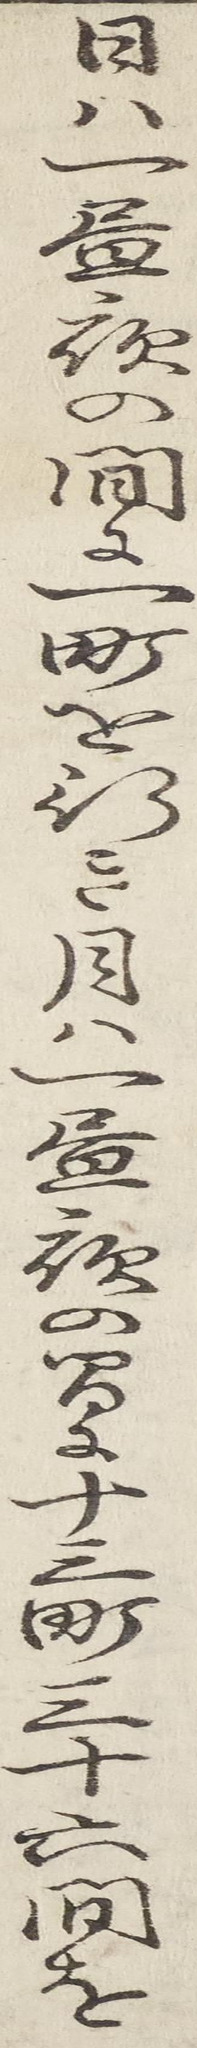日は一昼夜の間に一町を行き月は一昼夜の間に十三町三十六間を
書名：平天儀圖解
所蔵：東京大学地震研究所図書室 Earthquake Research Institute Library, The University of Tokyo, JAPAN
